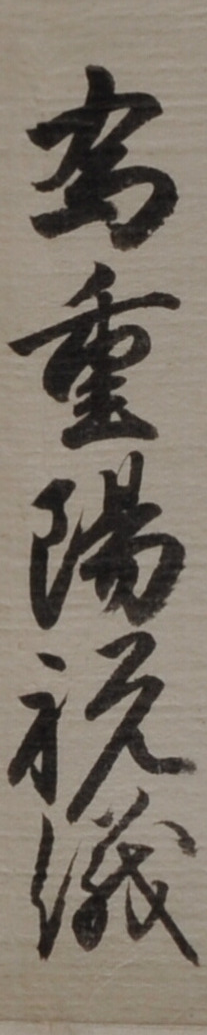為重陽祝儀
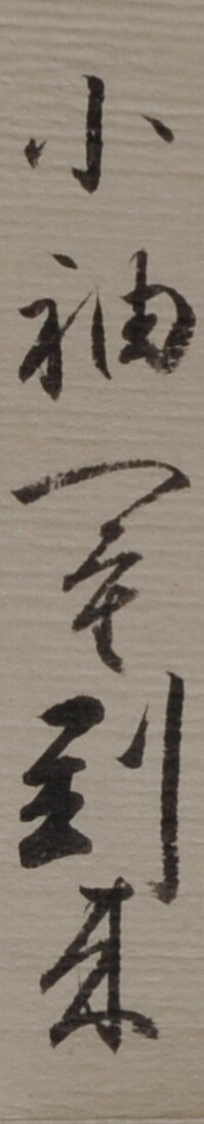小袖一重到来
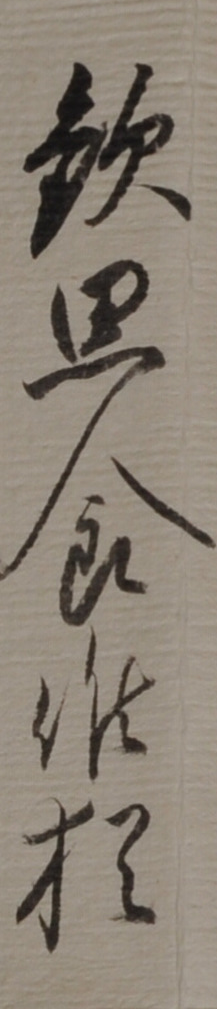歓思食候猶
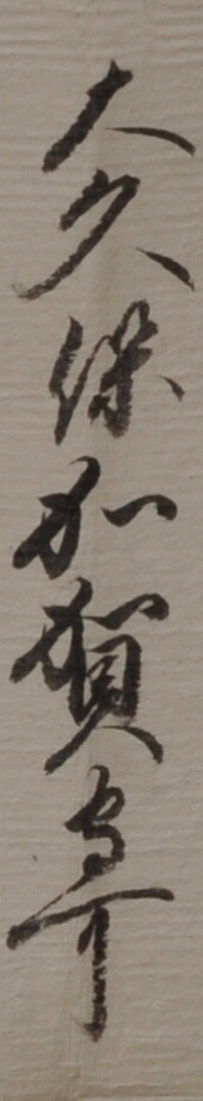大久保加賀守可
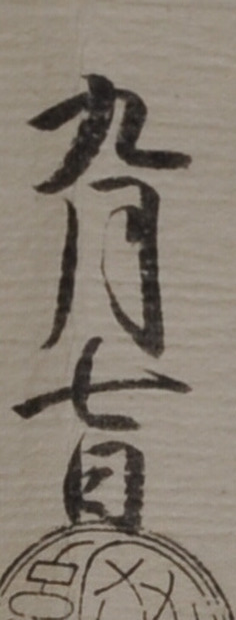九月七日
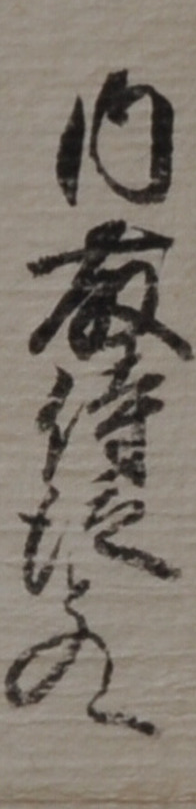内藤侍従とのへ
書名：御内書
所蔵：伊那市立高遠町図書館・合同会社AMANE
